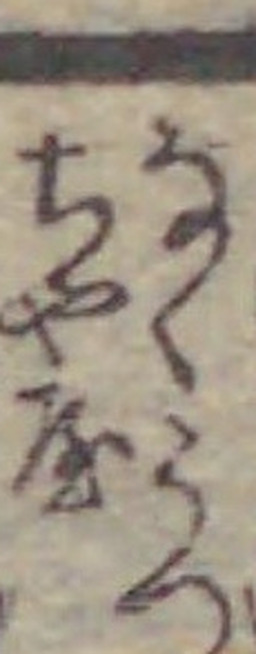ちや屋
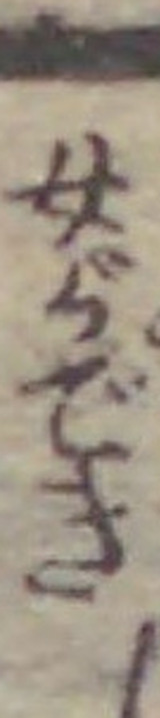女ができ
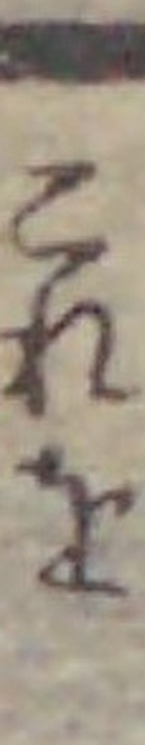これを
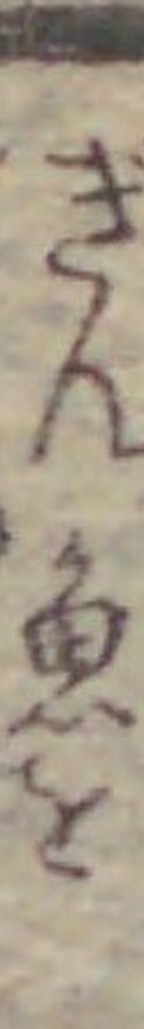ぎん魚を
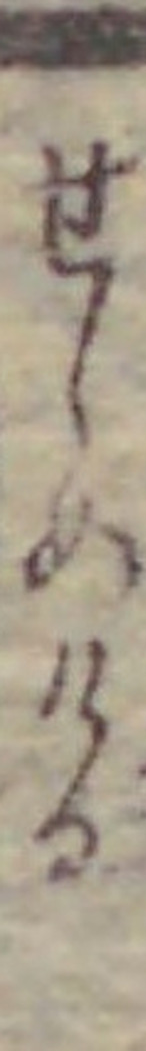せしめける
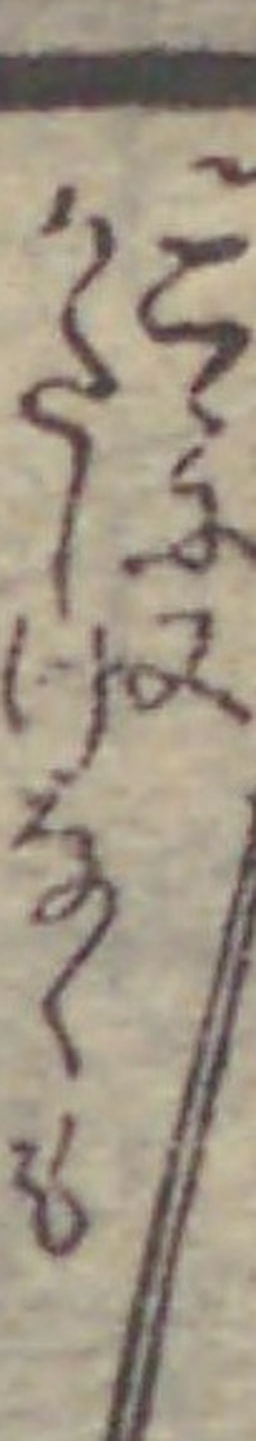かたしけなくも
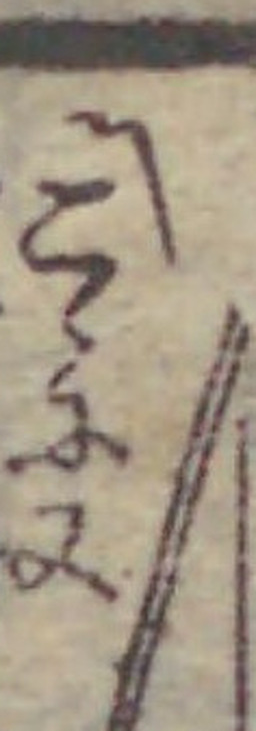〽こゝに又
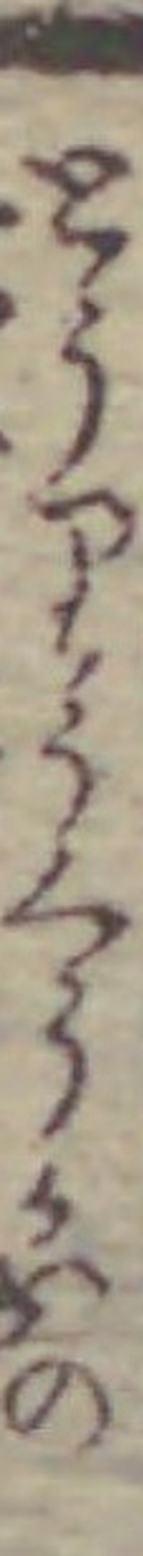とうりうくうかの
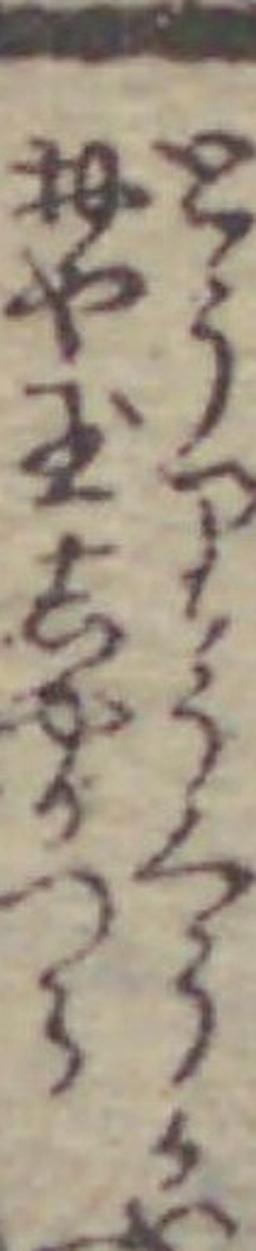おや玉しやがつら
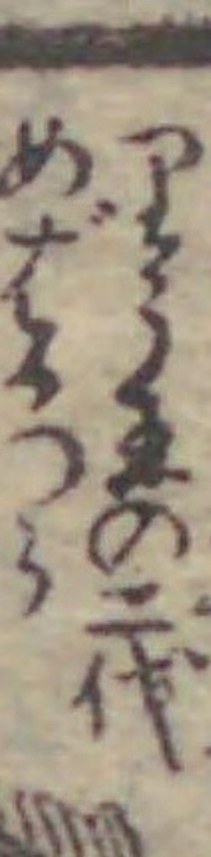めばかつら
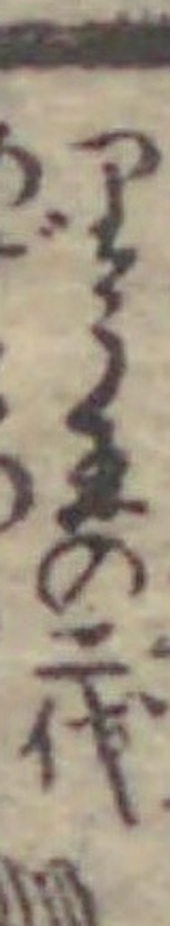りう王の二代
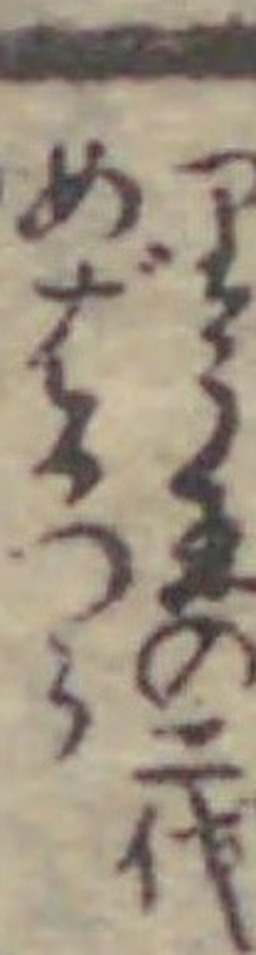めばかつら
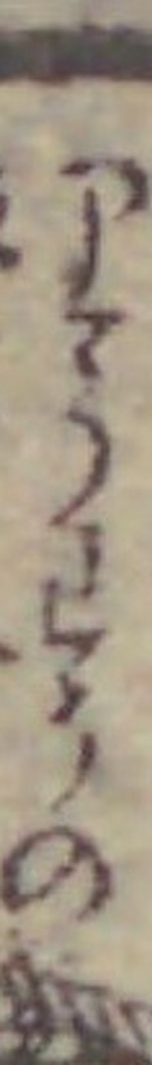りうわうの
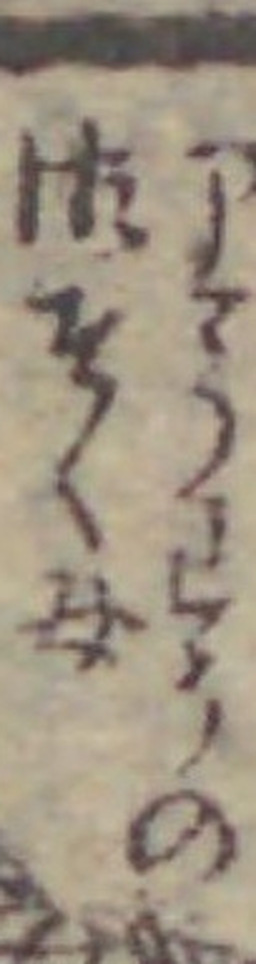御そく女
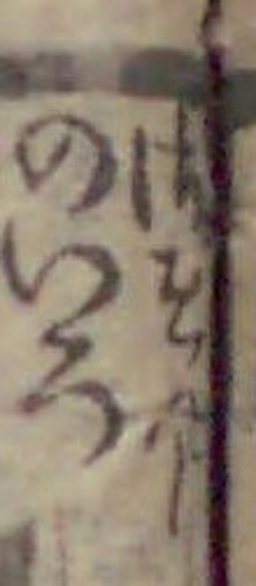のいろ
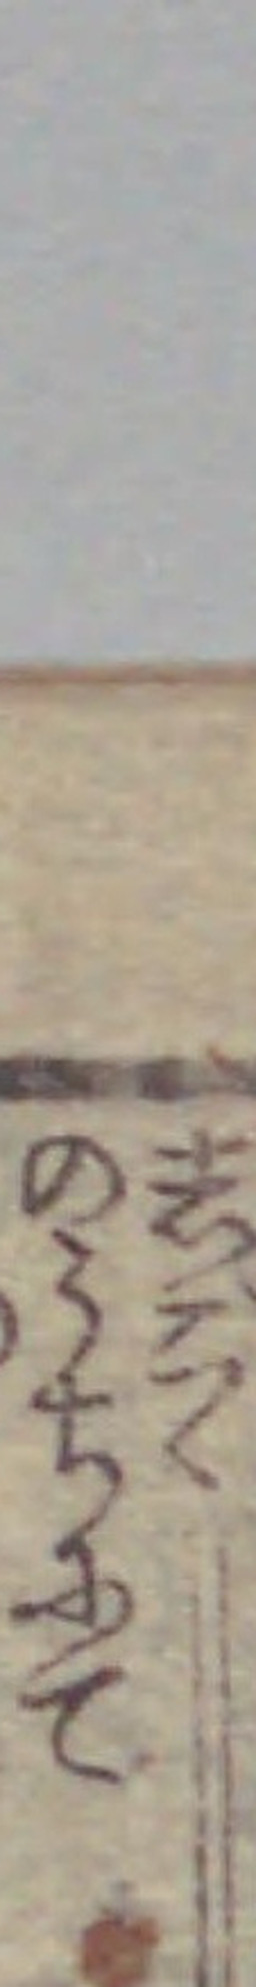のうちにて
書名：箱入娘面屋人魚 3巻
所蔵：国立国会図書館 National Diet Library, JAPAN
